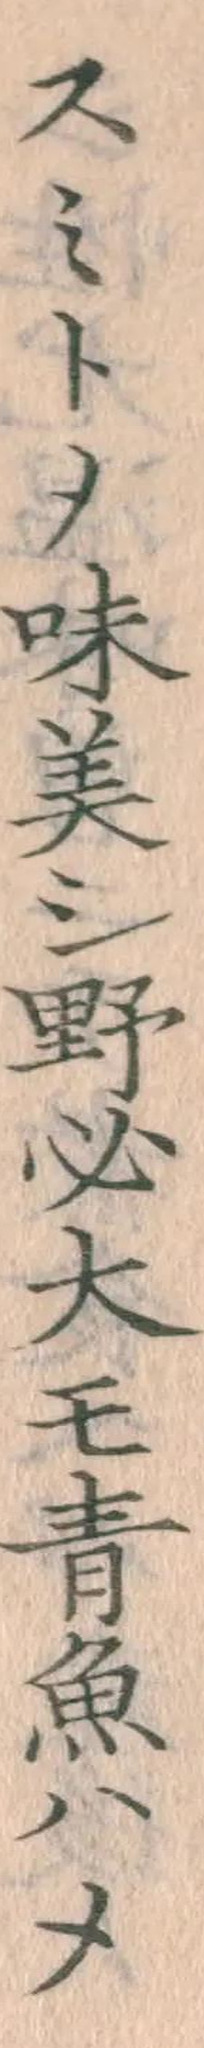スミトシテ味美シ野必大モ青魚ハメ
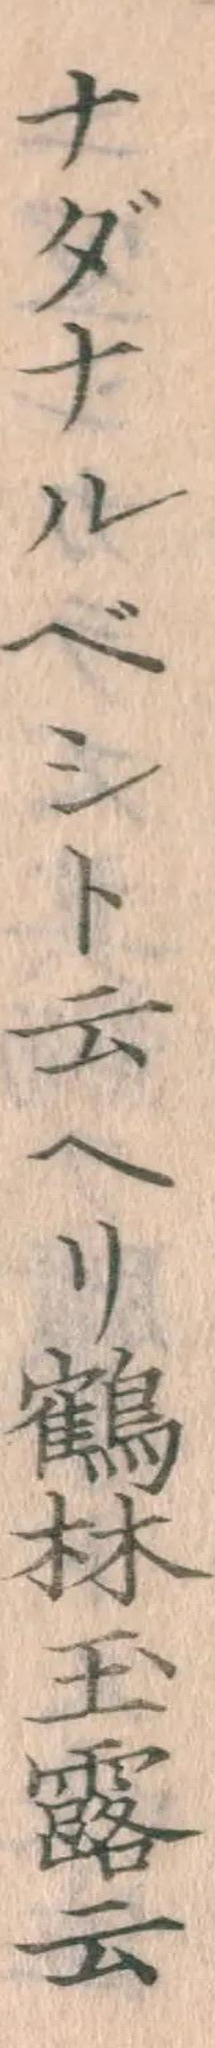ナダナルベシト云ヘリ鶴林玉露云
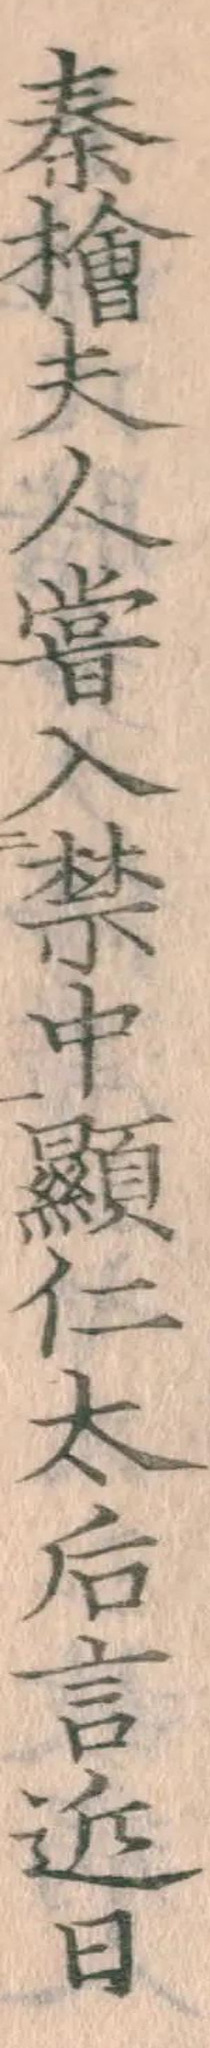秦檜夫人嘗入禁中顕仁太后言近日
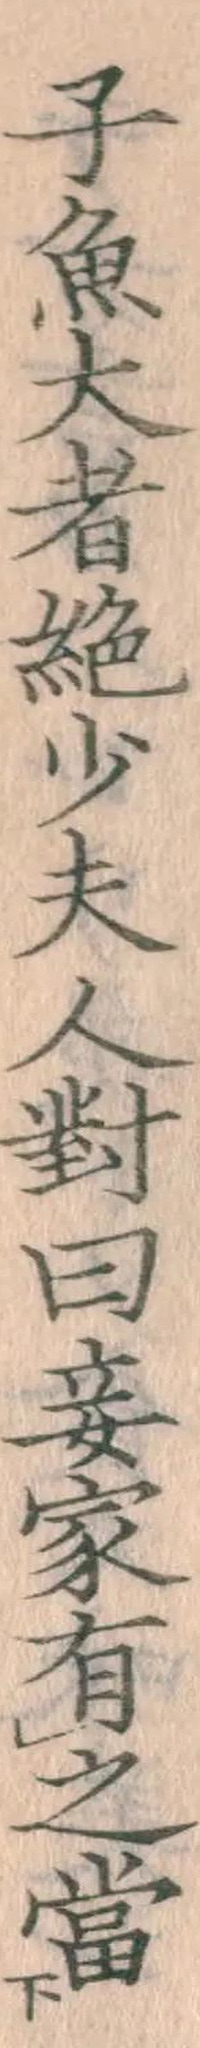子魚大者絶少夫人対曰妾家有之当
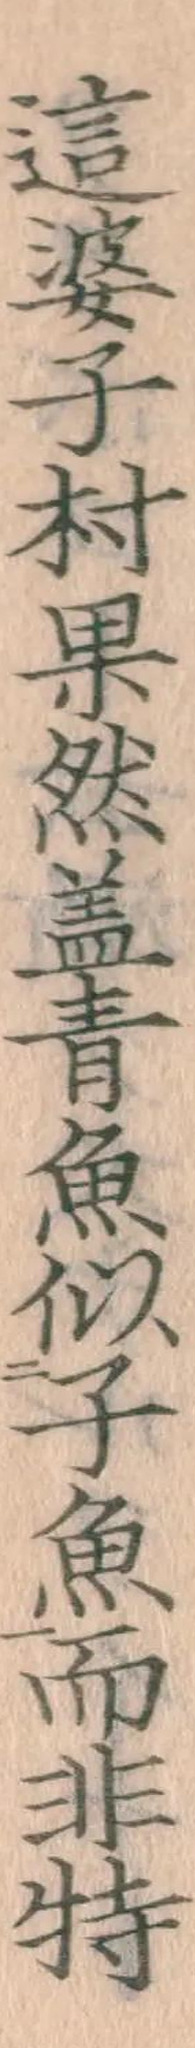這婆子村果然蓋青魚似子魚而非特
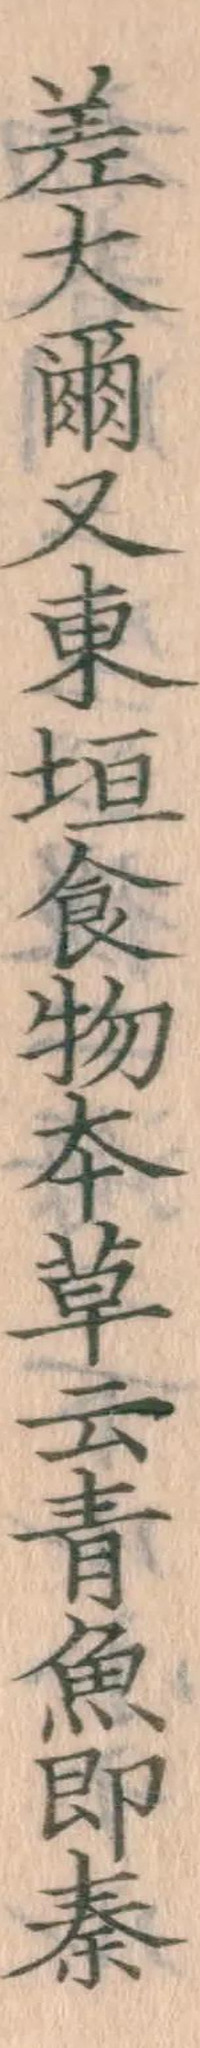差大爾又東垣食物本草云青魚即秦
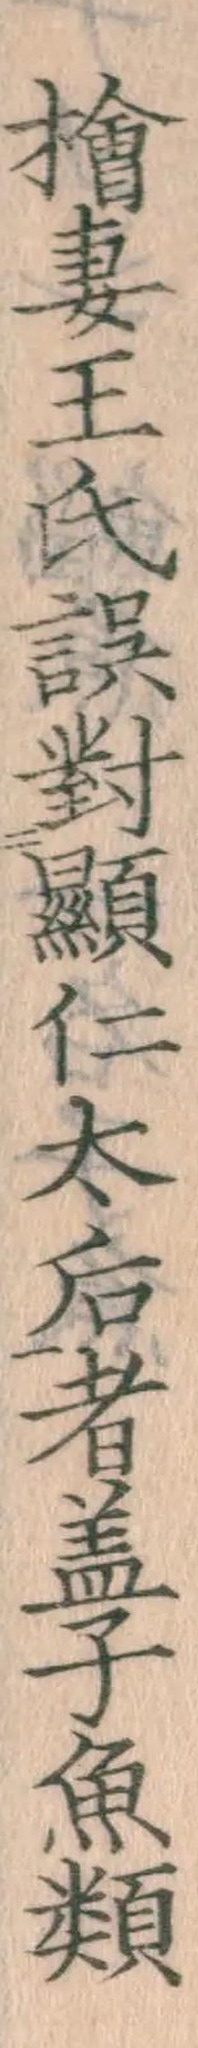檜妻王氏誤対顕仁太后者蓋子魚類
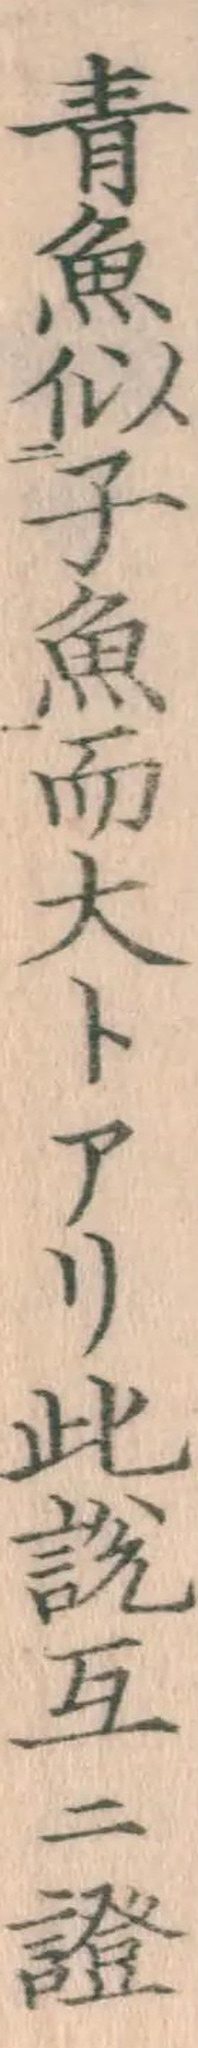青魚似子魚而大トアリ此説互ニ証
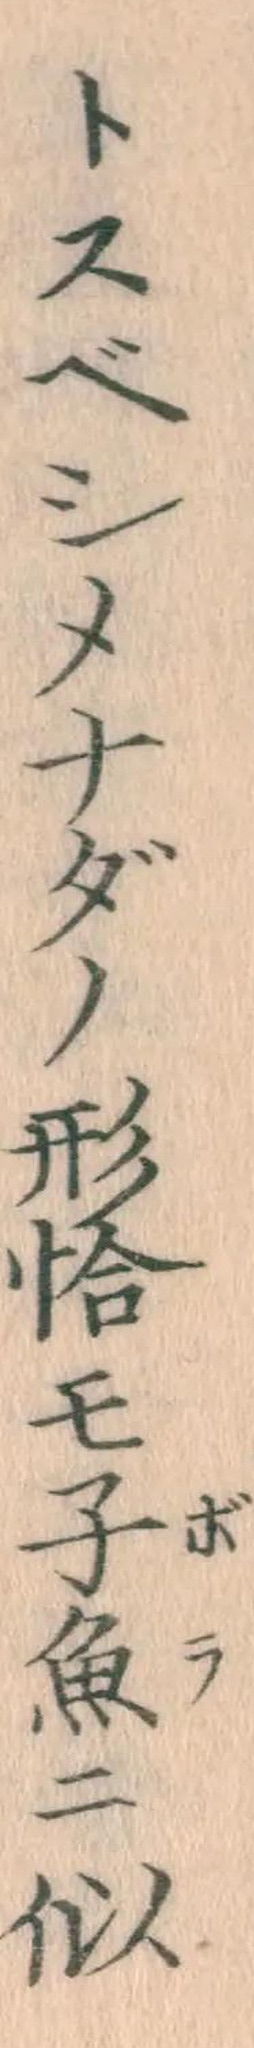トスベシメナダノ形恰モ子魚ニ似
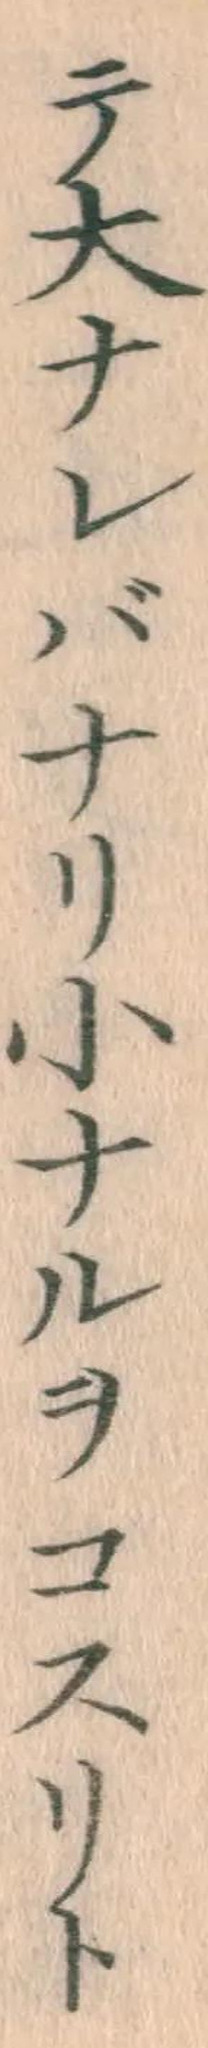テ大ナレバナリ小ナルヲコスリト
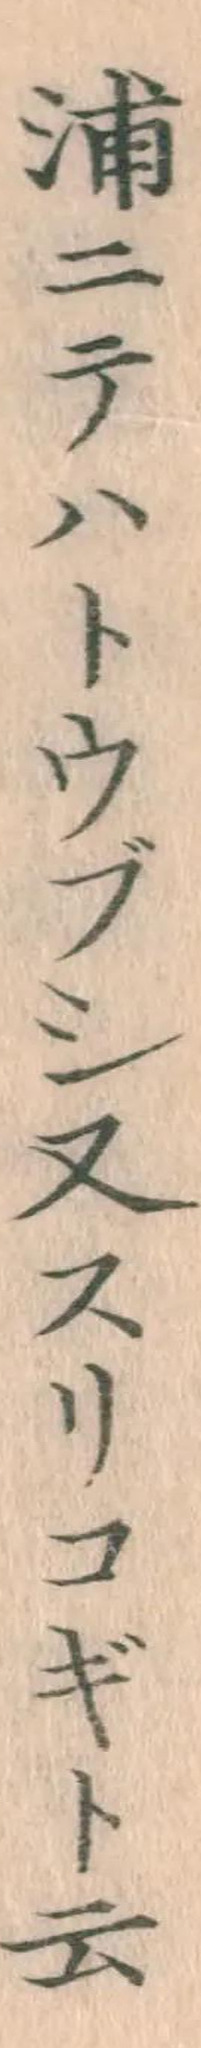浦ニテハトウブシ又スリコギト云
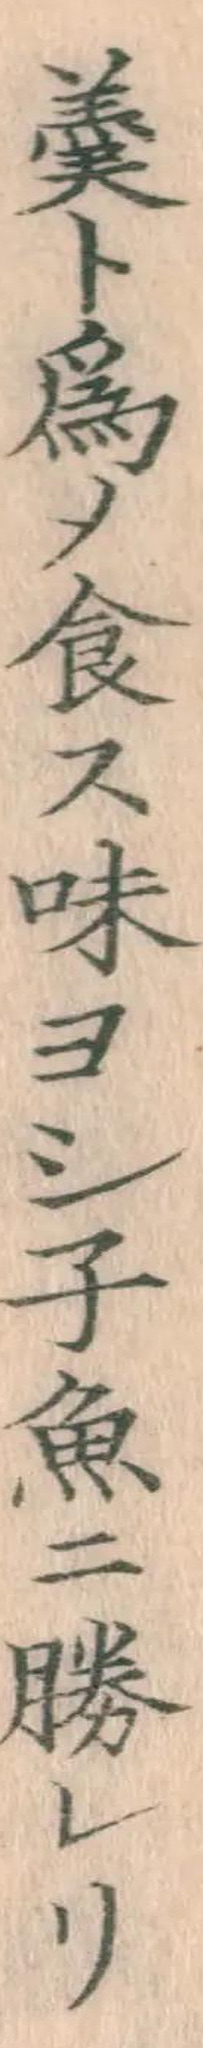羹ト為シテ食ス味ヨシ子魚ニ勝レリ
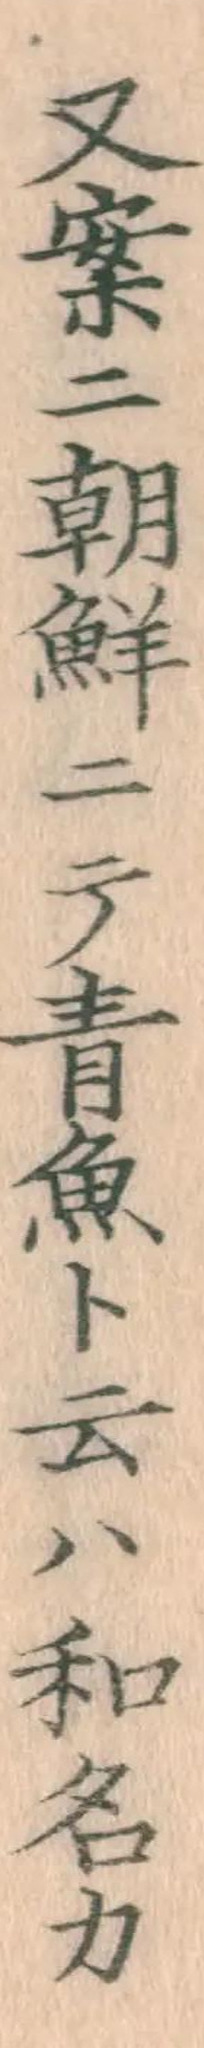又案ニ朝鮮ニテ青魚ト云ハ和名カ
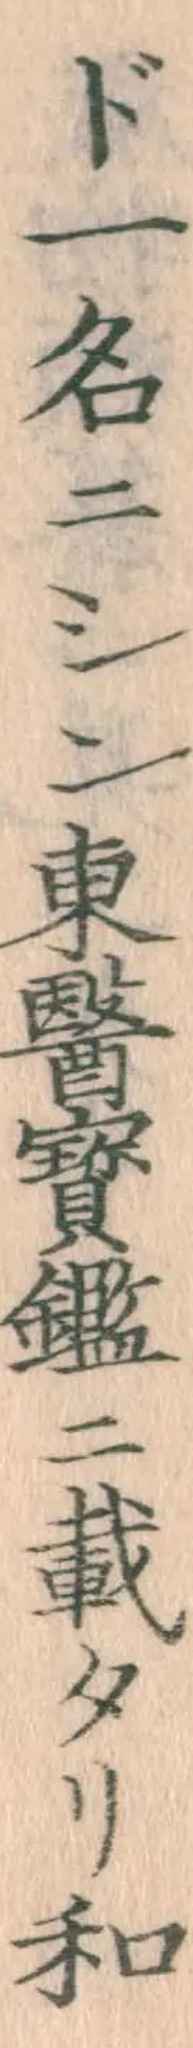ド一名ニシン東医宝鑑ニ載タリ和
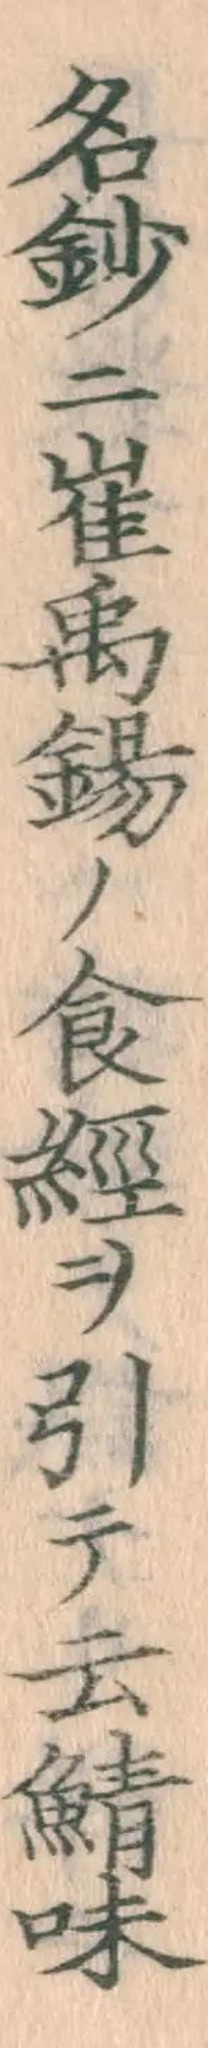名鈔ニ崔禹錫ノ食経ヲ引テ云鯖味
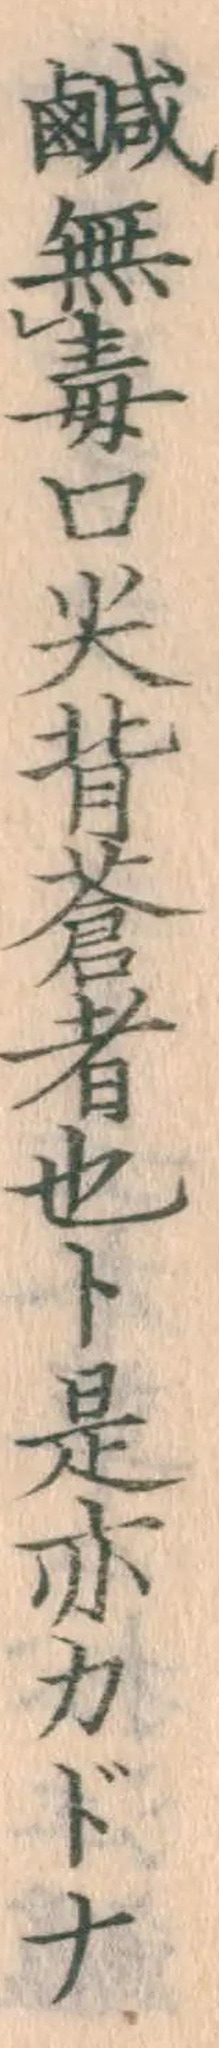鹹無毒口尖背蒼者也ト是亦カドナ
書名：皇和魚譜 2巻
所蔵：国立国会図書館 National Diet Library, JAPAN
